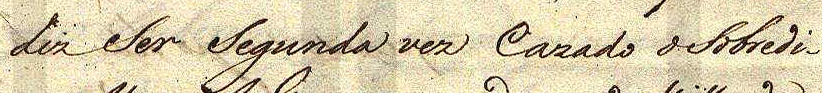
diz Ser Segunda vez cazado o Sobredi
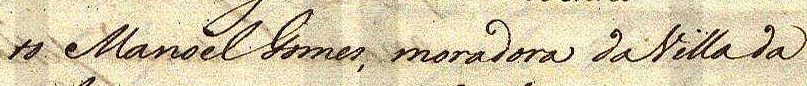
ro Manoel Gomes, moradora da Villa da
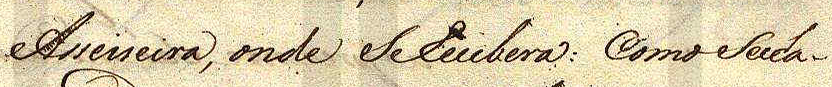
Asseiseira, onde se Recebera: Como Se cha
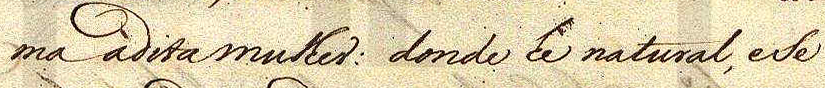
ma a dita mulher: donde he natural, e Se
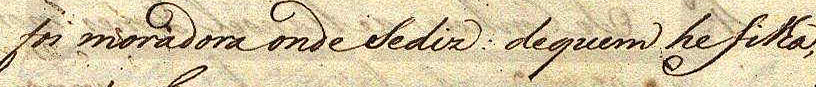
foi moradora onde Se diz: de quem he filha,
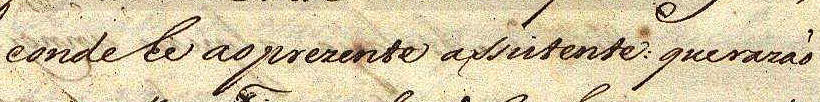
e onde he ao prezente assistente: que razaõ
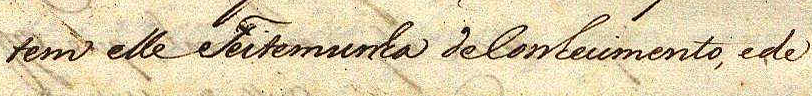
tem elle Testemunha de Conhecimento, e de
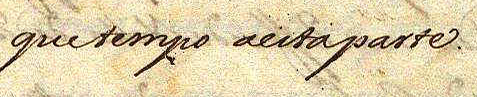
que tempo a esta parte.
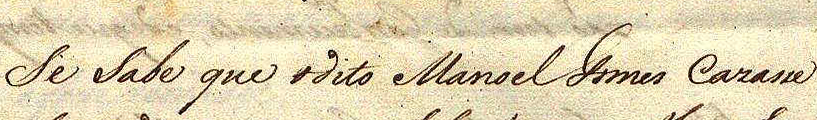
Se Sabe que o dito Manoel Gomes Cazasse
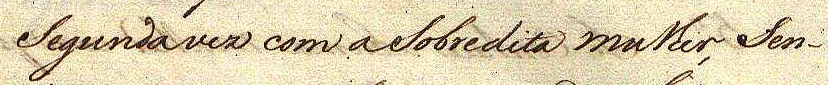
Segunda vez com a Sobredita mulher, Sen
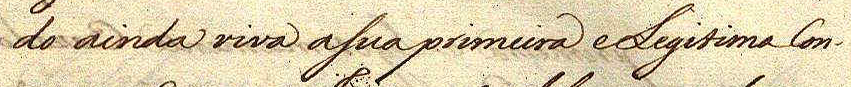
do ainda viva a sua primeira e Legitima Con
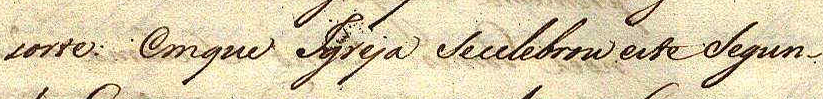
sorte: Em que Igreja se celebrou este Segun
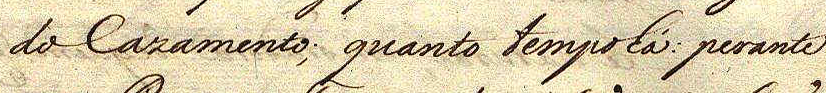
do Cazamento; quanto tempo há: perante
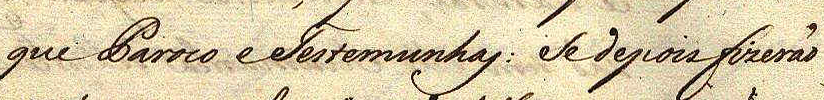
que Paroco e Testemunhas: se depois fizeraõ
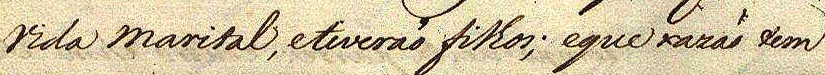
vida marital, e tiveraõ filhos; e que razaõ tem
